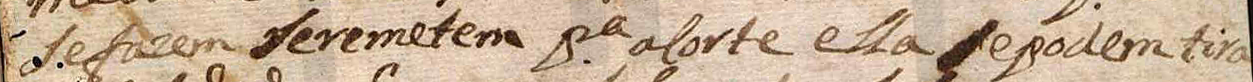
se fazem se remetem p.a a Corte ella se podem tira
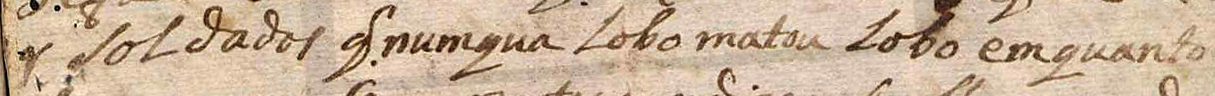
r soldados q̄. numqua Lobo matou Lobo emquanto
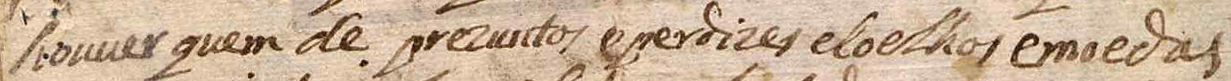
houuer quem de prezuntos e perdizes e Coelhos e moedas
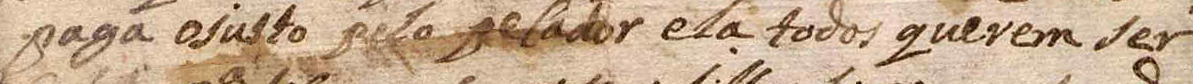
paga o iusto pelo peCador e la todos querem ser
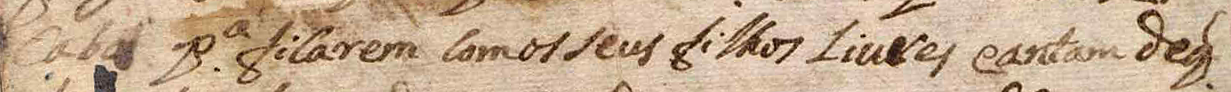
Cabo p.a ficarem com os seus filhos Liures e antam de q̄.
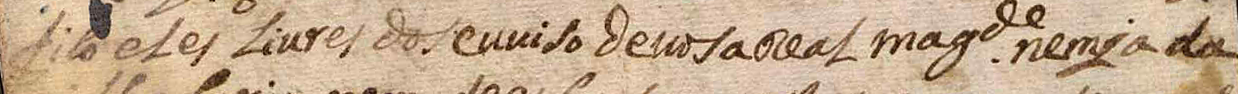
fico eles Liures do seuuiso de uosa Real mag.de nem ja da
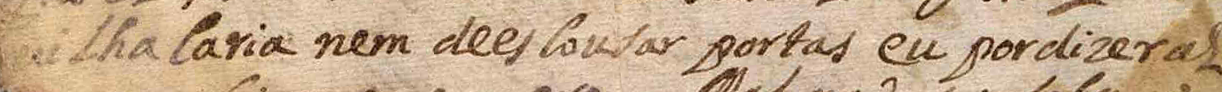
uilhaCaria nem de esCousar portas eu por dizer al
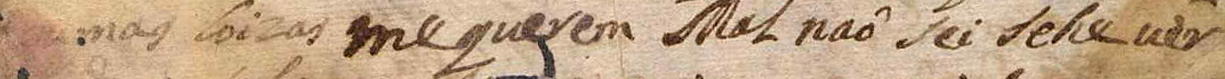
gumas Coizas me querem MaL naõ sei se he uer
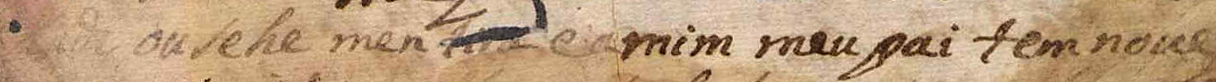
dade ou se he mentira e a mim meu pai tem noue
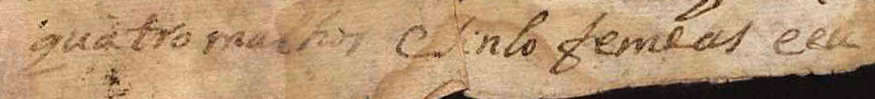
quatro maChos e sinCo femeas e eu
